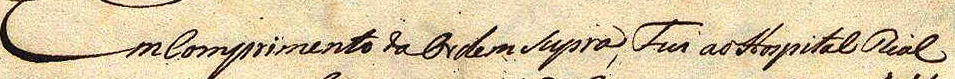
Em Comprimento da Ordem supra, Fui ao Hospital Rial
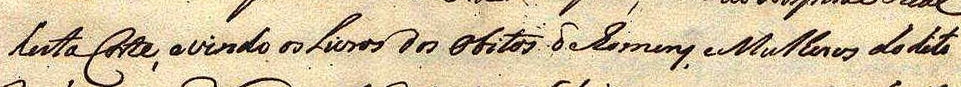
desta Corte, e vindo os Livros dos Obitos de homens, e Mulheres do dito
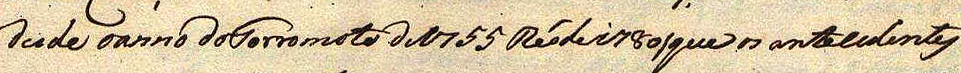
desde o anno do Terramoto de 1755 thé o de i780/ que os antecedentes
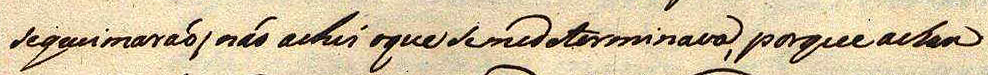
se queimaraõ/ não achei o que se me determinava, porque achan
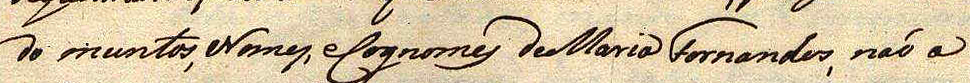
do muntos, Nomes, e Cognomes de Maria Fernandes, naõ a
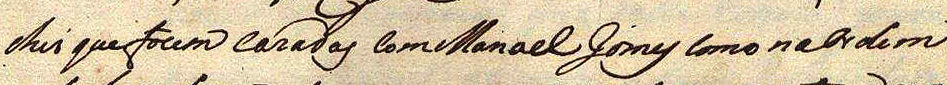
chei que focem cazadas com Manoel Gomes como na Ordem
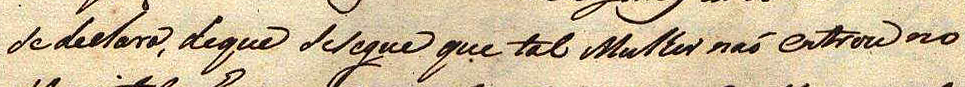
se declara, de que se segue que tal Mulher naõ entrou no
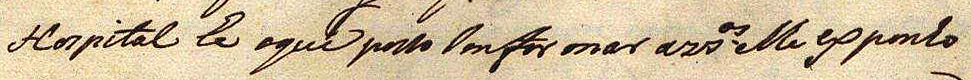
Hospital he o que posso Conformar a v s.as e lhe exponho
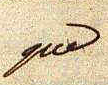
que
